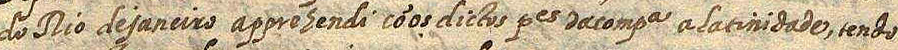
do Rio de janeiro apprehendi cō os dictos pes da compa a Latinidade, tendo
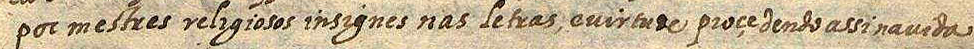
por mestres religiosos insignes nas Letras, e uirtude proçedendo assi na uida
